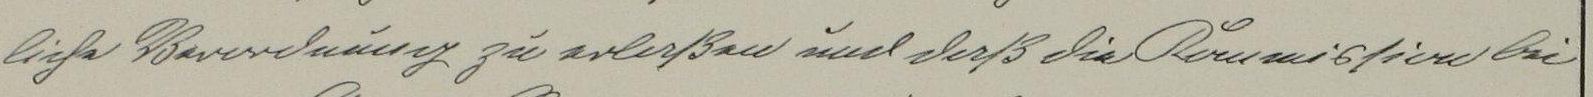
liche Verordnung zu erlaßen und daß die Kommission bei
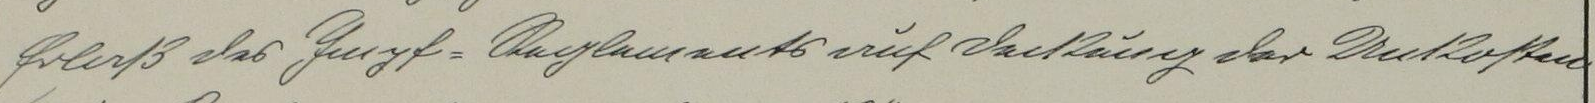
Erlaß des Impf-Reglements auf Deckung der Unkosten
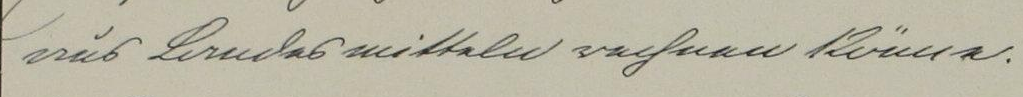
aus Landesmitteln rechnen könne.
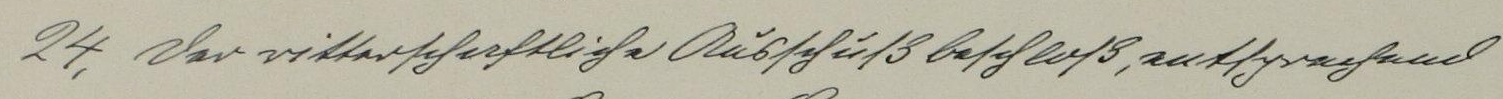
24. Der ritterschaftliche Ausschuß beschloß, entsprechend
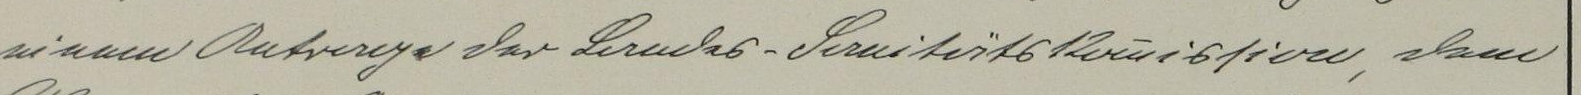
einem Antrage der Landes-Sanitätskommission, dem
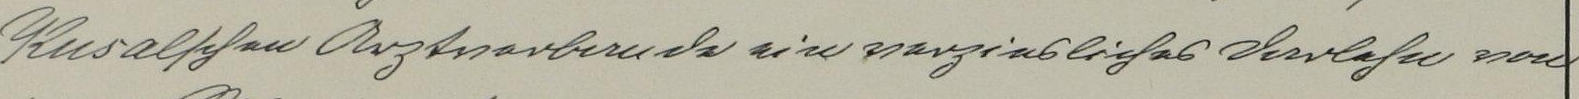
Kusalschen Arztverbande ein verzinsliches Darlehn von
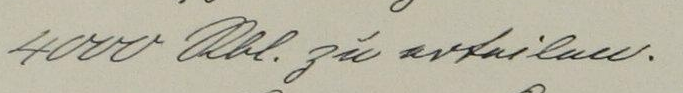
4000 Rbl. zu erteilen.
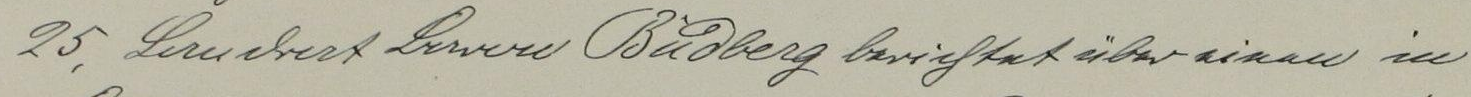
25. Landrat Baron Budberg berichtet über einen in
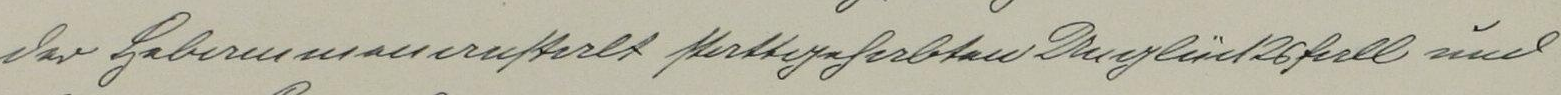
der Hebammenanstalt stattgehabten Unglücksfall und
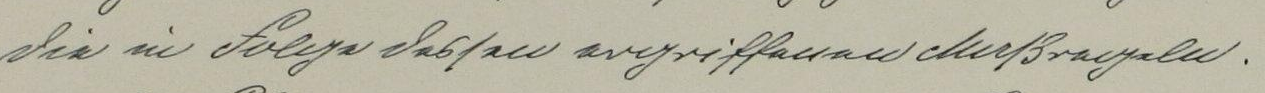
die in Folge dessen ergriffenen Maßregeln.
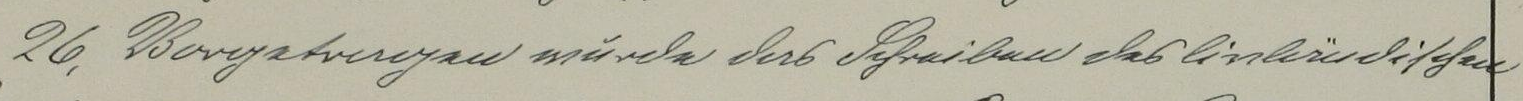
26. Vorgetragen wurde das Schreiben des livländischen
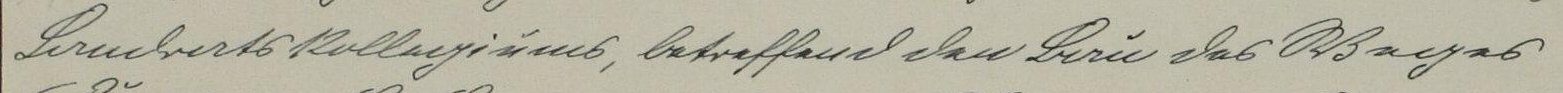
Landratskollegiums, betreffend den Bau des Weges
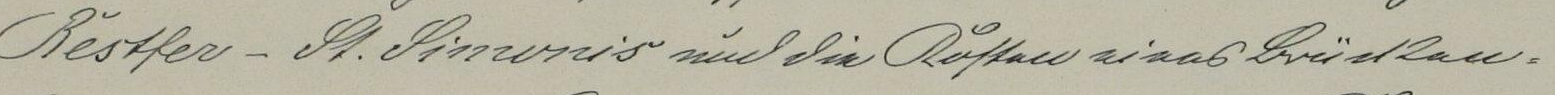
Restfer-St. Simonis und die Kosten eines Brücken-
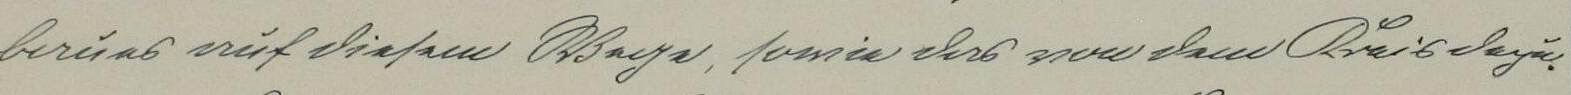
baues auf diesem Wege, sowie das von dem Kreisdepu-
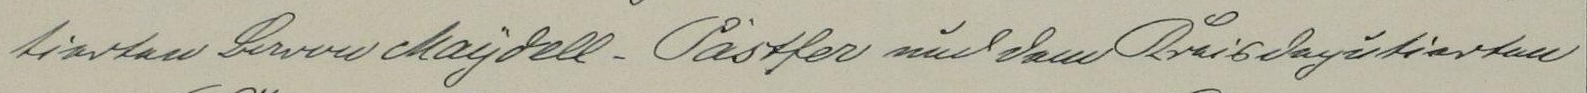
tierten Baron Maydell-Pastfer und dem Kreisdeputierten
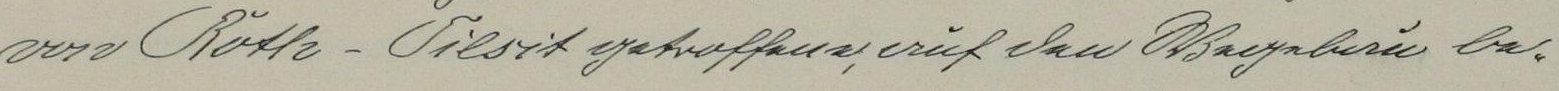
von Roth-Tilsit getroffene, auf den Wegebau be-
